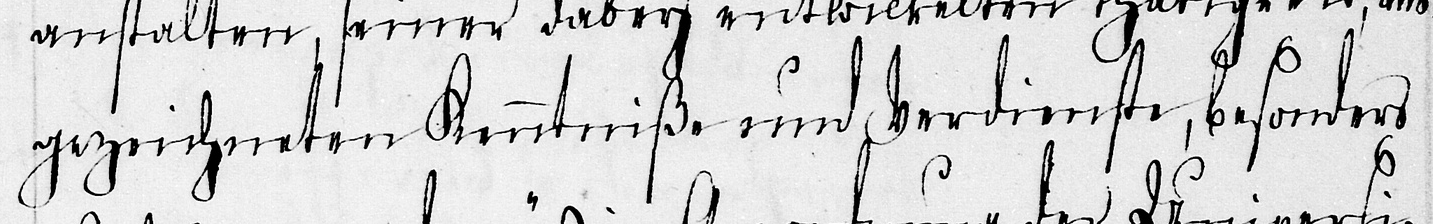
gezeichneten Kenntniße und Verdienste, besonders
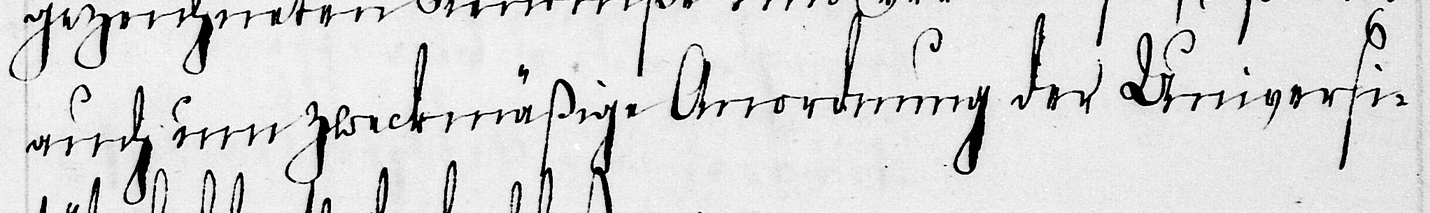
auch um zweckmäßige Anordnung der Universi¬
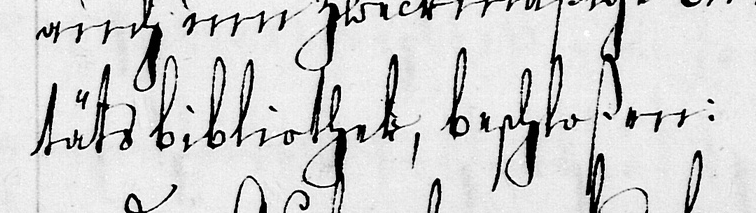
tätsbibliothek, beschloßen:
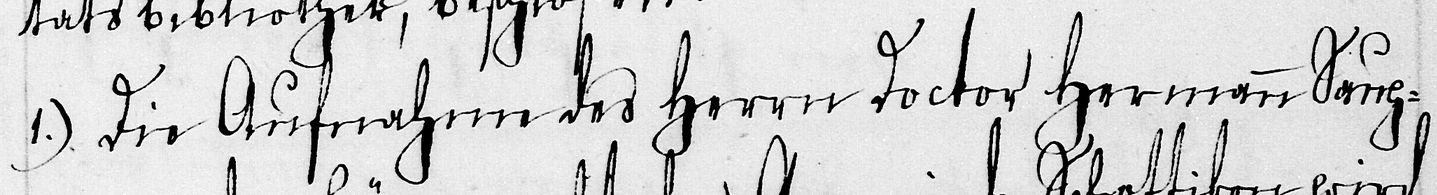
1.) Die Aufnahme des Herrn Doctor Hermann Saup¬
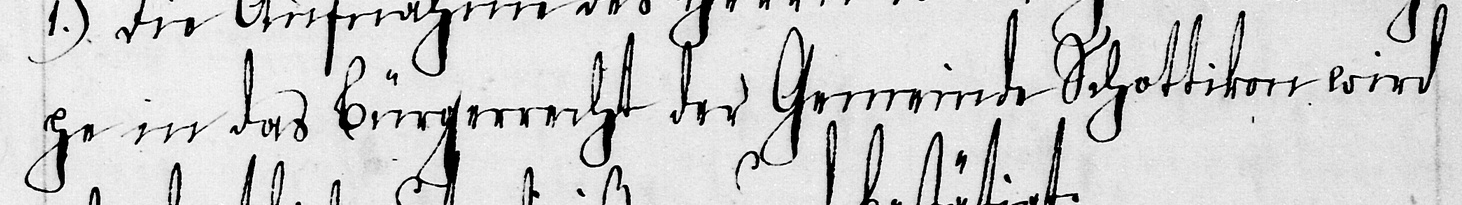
pe in das Bürgerrecht der Gemeinde Schottikon wird
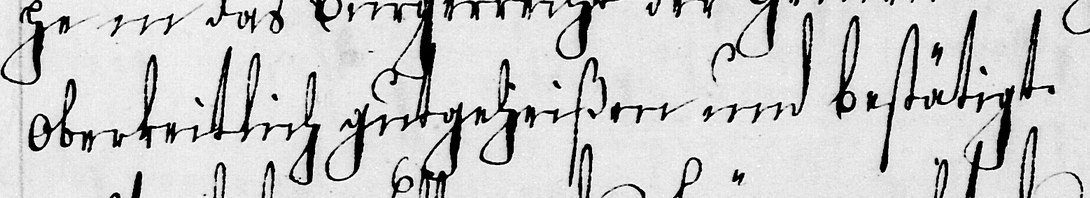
oberkeitlich gutgeheißen und bestätigt.
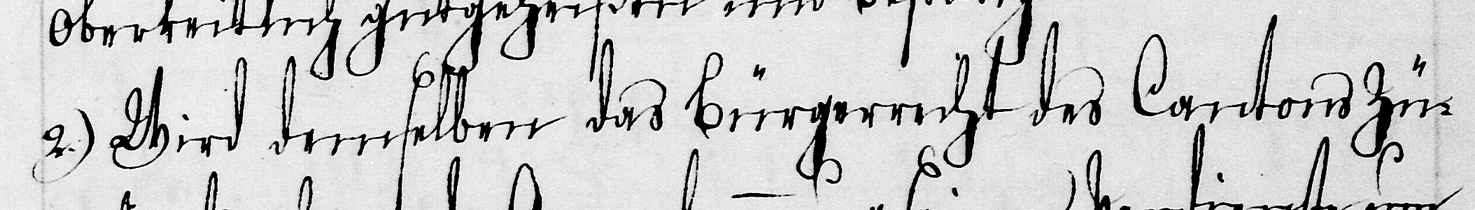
2.) Wird demselben das Bürgerrecht des Cantons Zü¬
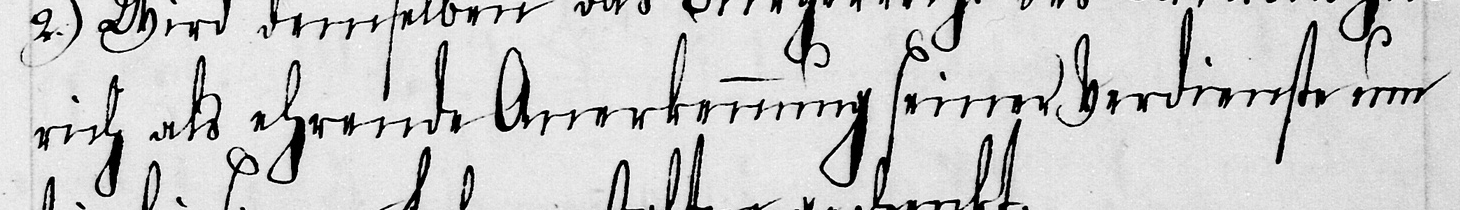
rich als ehrende Anerkennung seiner Verdienste um
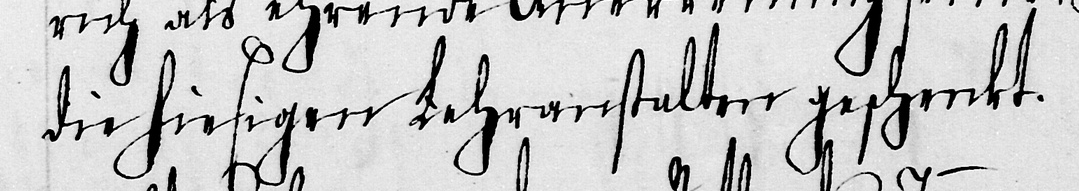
die hiesigen Lehranstalten geschenkt.
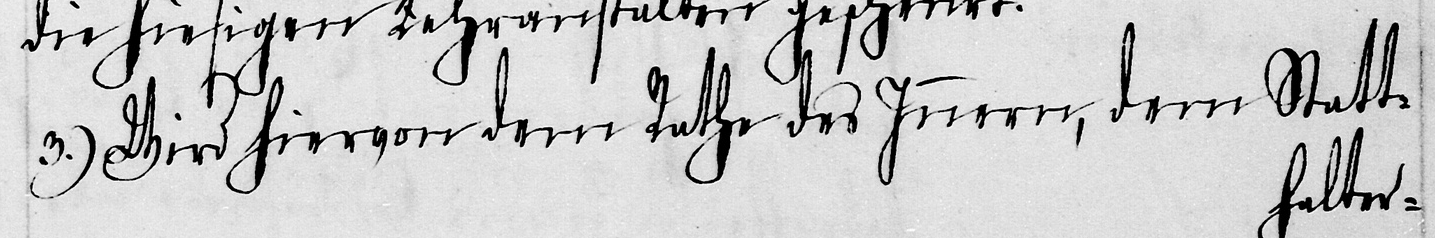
3.) Wird hiervon dem Rathe des Innern, dem Statt-
